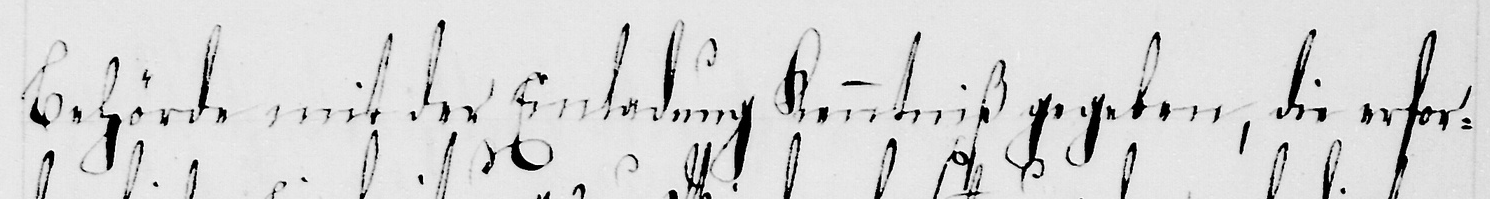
Behörde mit der Entlaßung Kenntniß gegeben, die erfor¬
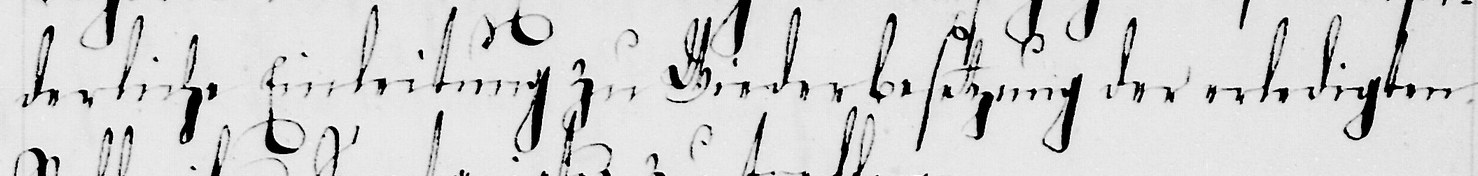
derliche Einleitung zu Wiederbesetzung der erledigten
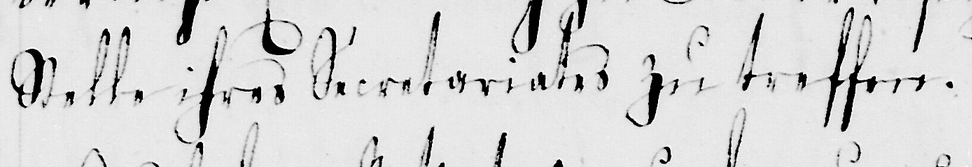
Stelle ihres Secretariates zu treffen.
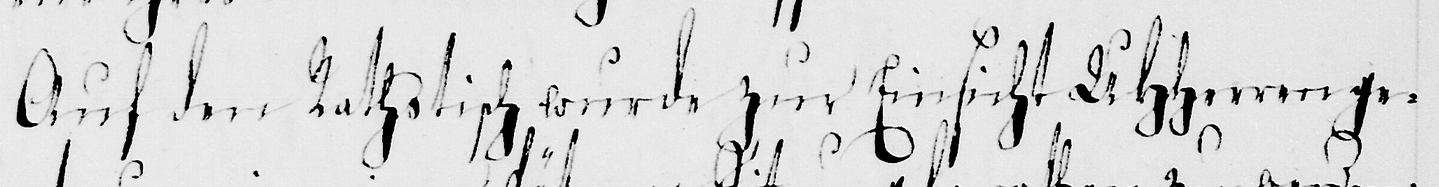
Auf den Rathstisch wurde zur Einsicht UHHerren ge¬
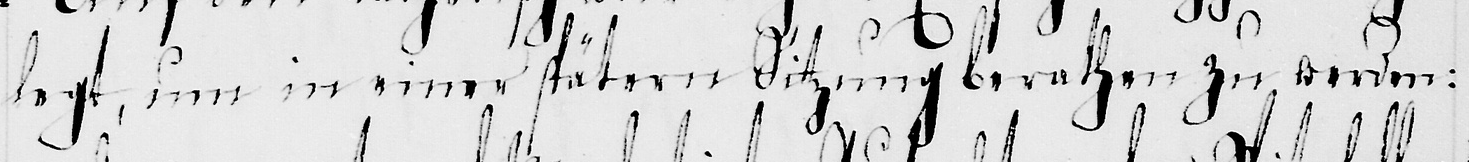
legt, um in einer spätern Sitzung berathen zu werden:
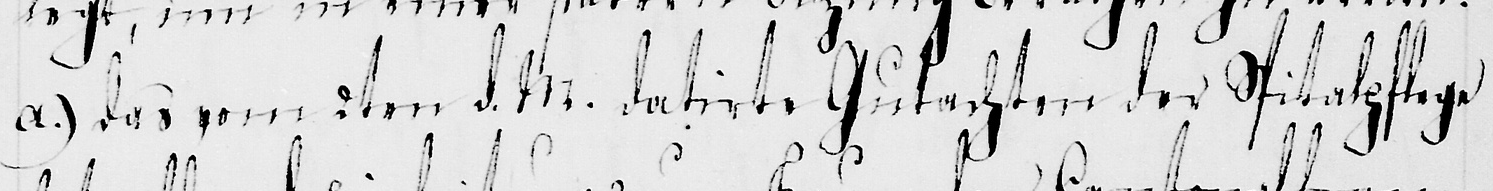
a.) das vom 2ten d. M. datirte Gutachten der Spitalpflege
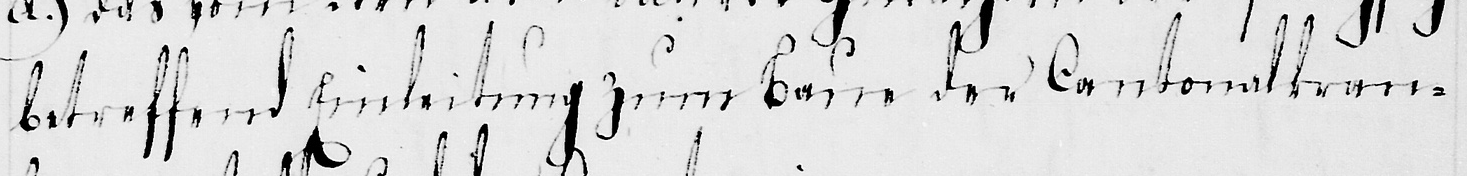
betreffend Einleitung zum Baue der Cantonalkran¬
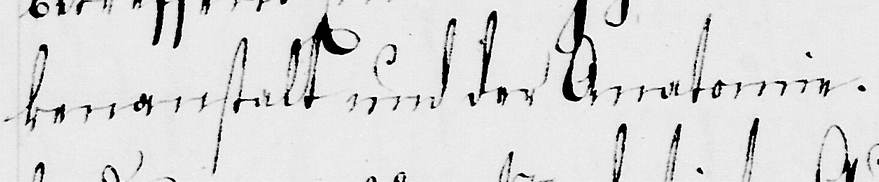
kenanstalt und der Anatomie.
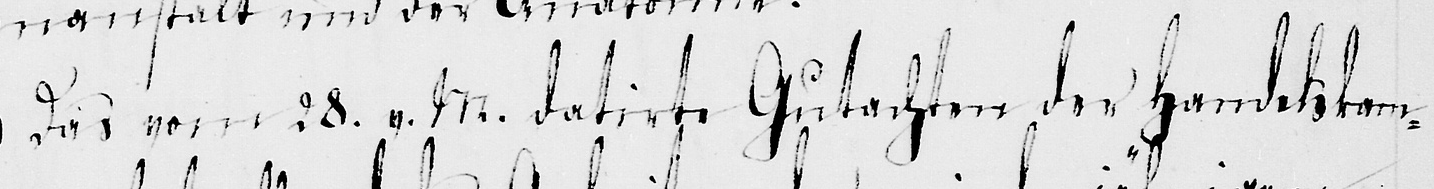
Das vom 28. v. M. datirte Gutachten der Handelskam¬
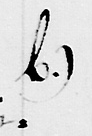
b.)
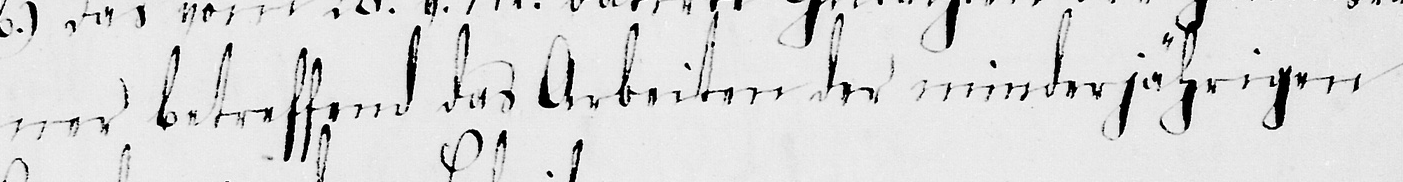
mer betreffend das Arbeiten der minderjährigen
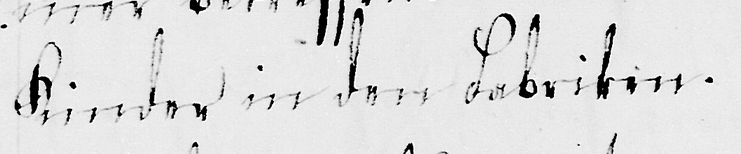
Kinder in den Fabriken.
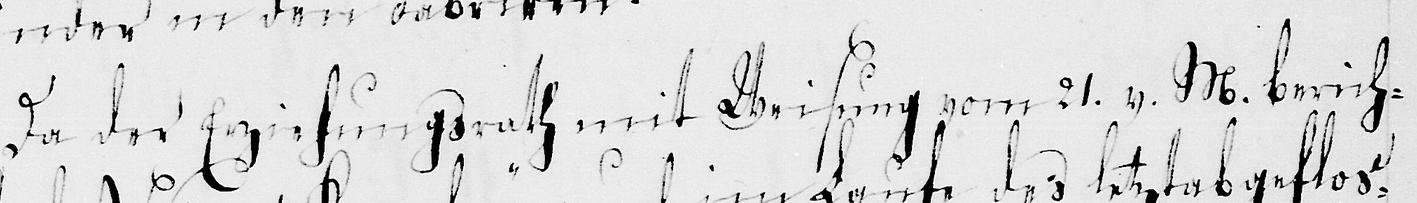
Da der Erziehungsrath mit Weisung vom 21 v. M. berich¬
